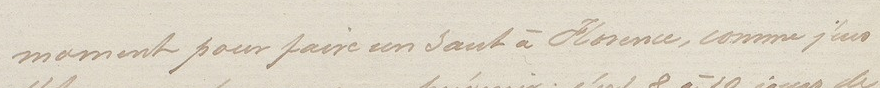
moment pour faire un saut à Florence, comme j'eus
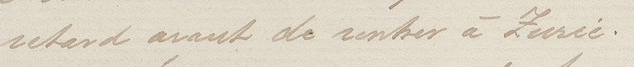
retard avant de rentrer à Zuric.
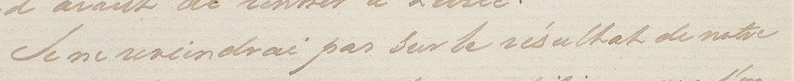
Je ne reviendrai pas sur le résultat de notre
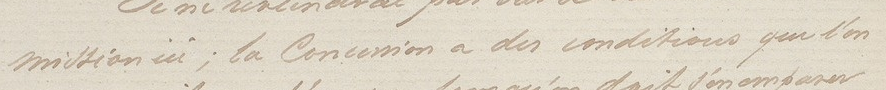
mission ici; la Concession a des conditions que l'on
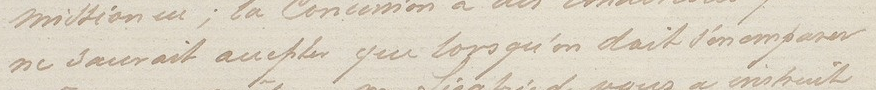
ne saurait accepter que lorsqu'on doit s'en emparer
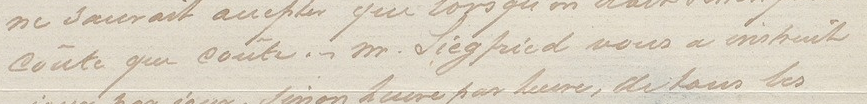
coûte que coûte. – M. Siegfried vous a instruit
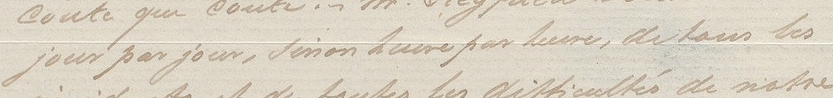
jour par jour, sinon heure par heure, de tous les
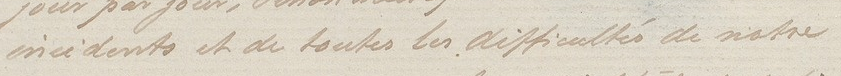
incidents et de toutes les difficultés de notre
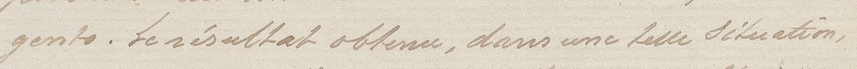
gents. Le résultat obtenu, dans une telle situation,
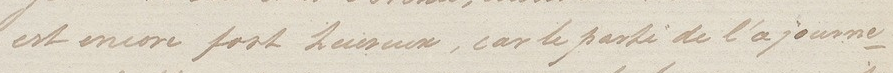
est encore fort heureux, car le parti de l'ajourne-
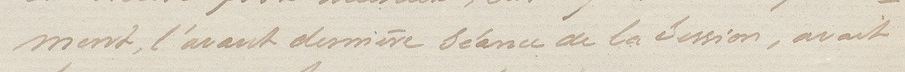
ment, l'avant dernière séance de la session, avait
